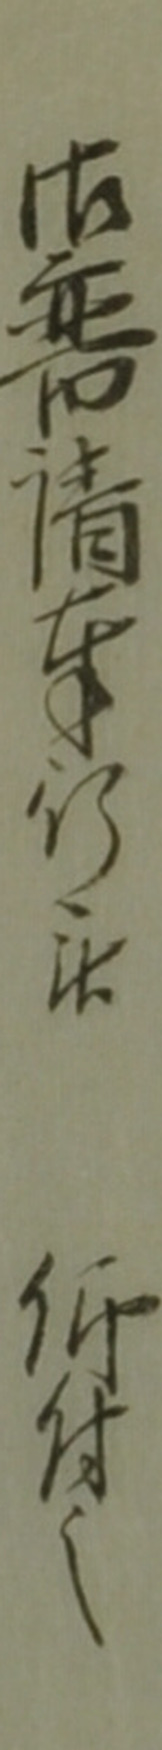御普請奉行被仰付之
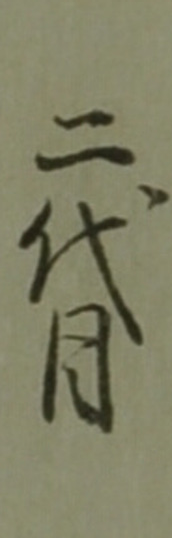二代目
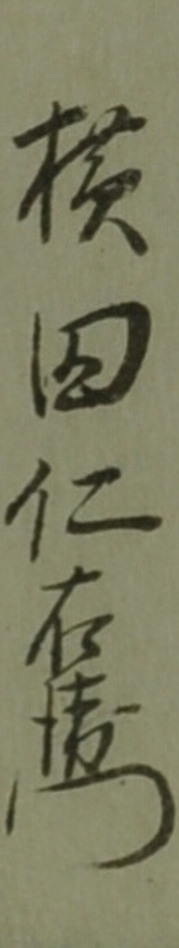横田仁右衛門
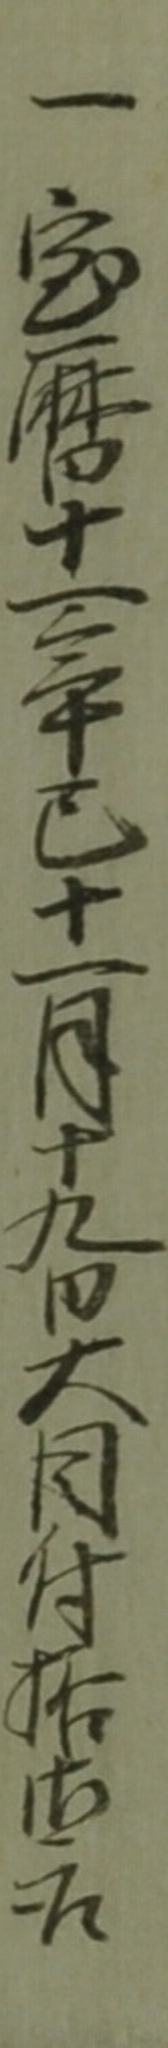一宝暦十一辛巳十一月十九日大目付格御取
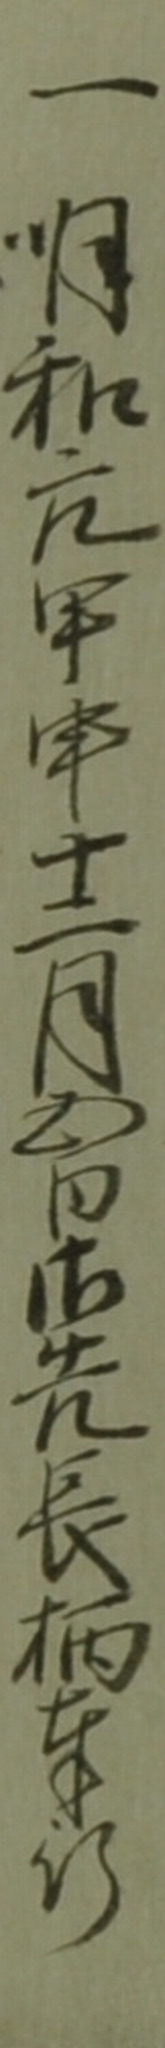一明和元甲申十二月五日御先長柄奉行
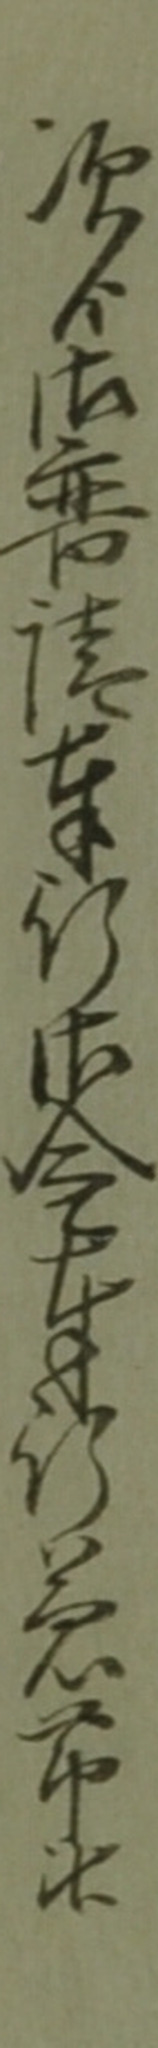次ゟ御普請奉行御金奉行兼帯被
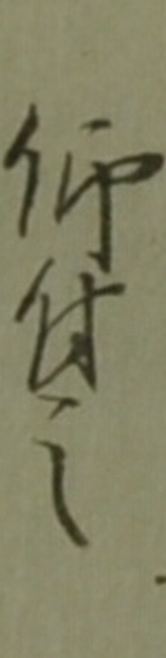仰付之
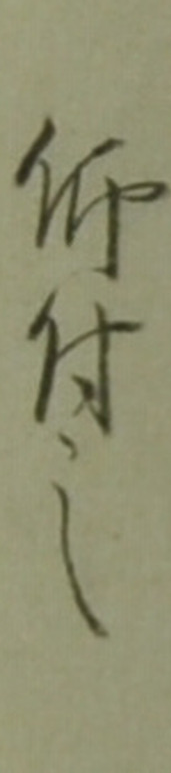仰付之
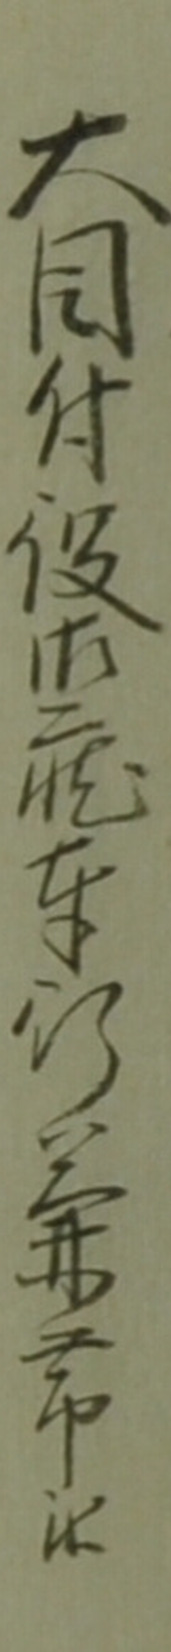大目付役御蔵奉行兼帯被
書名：諸御役代々録（六）
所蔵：伊那市立高遠町図書館・合同会社AMANE
